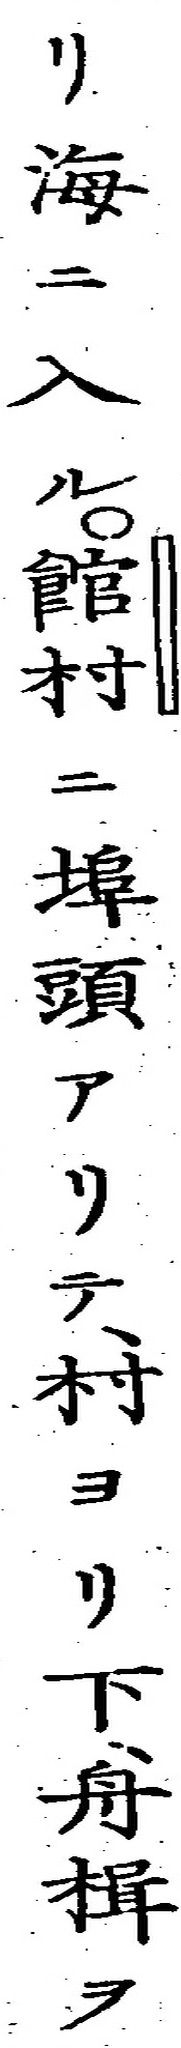リ海ニ入ル。館村ニ埠頭アリテ、村ヨリ下、舟楫ヲ
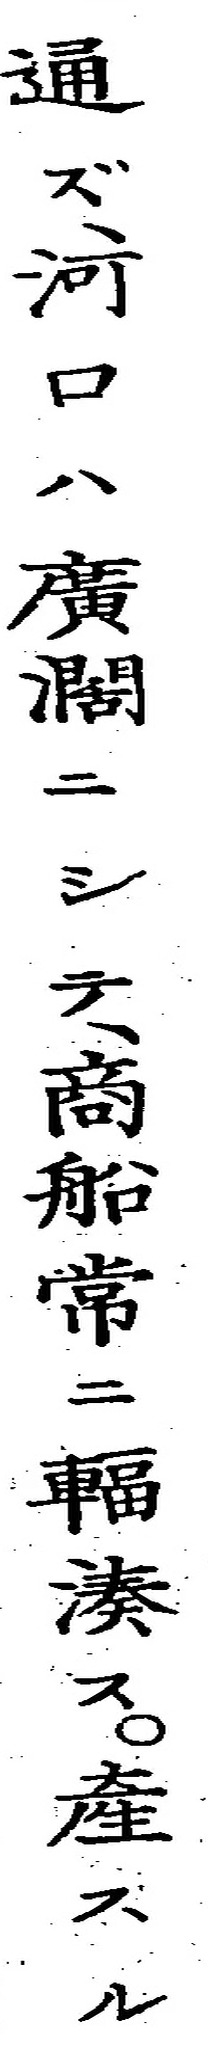通ズ、河口ハ広闊ニシテ、商船常ニ輻湊ス。産スル
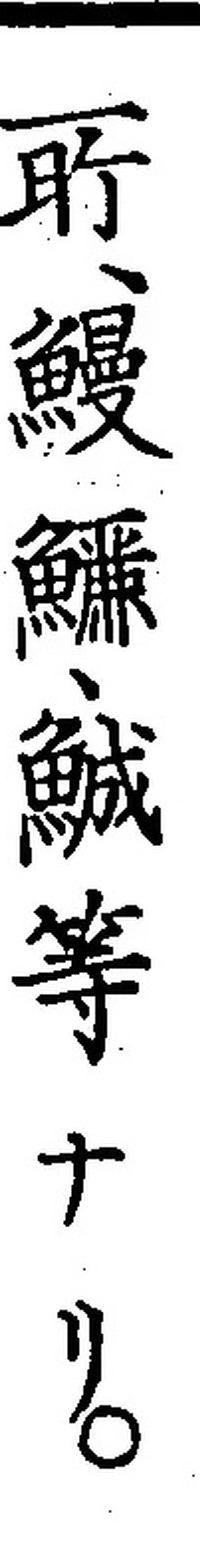所、鰻鱺・鯎等ナリ。
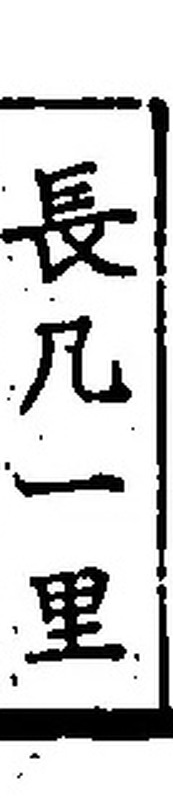長凡一里
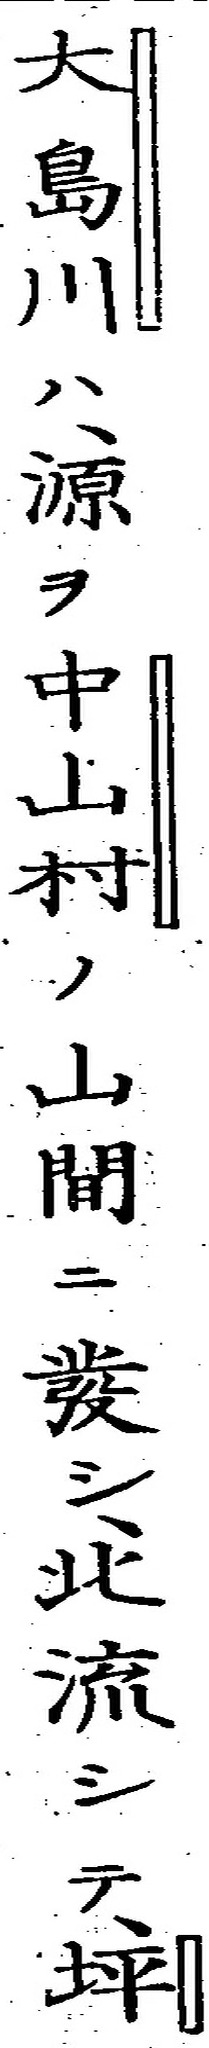大島川ハ、源ヲ中山村ノ山間ニ発シ、北流シテ、坪
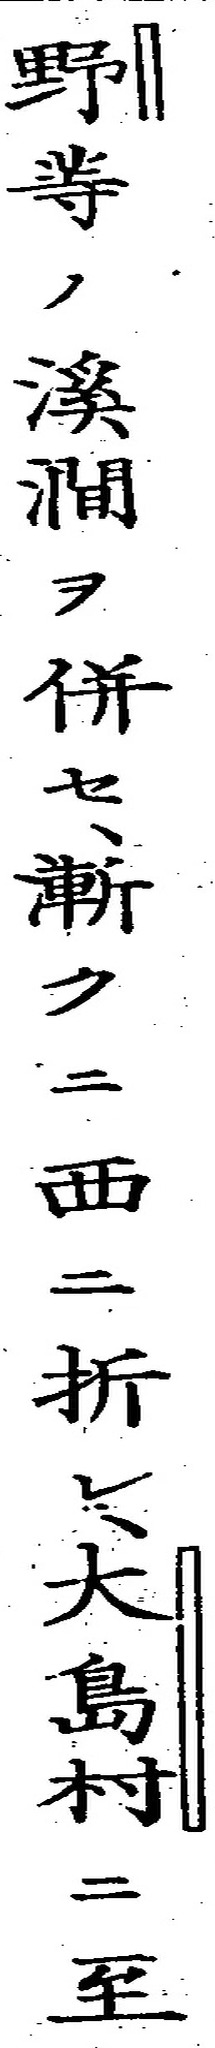野等ノ渓澗ヲ併セ、漸クニ西ニ折レ、大島村ニ至
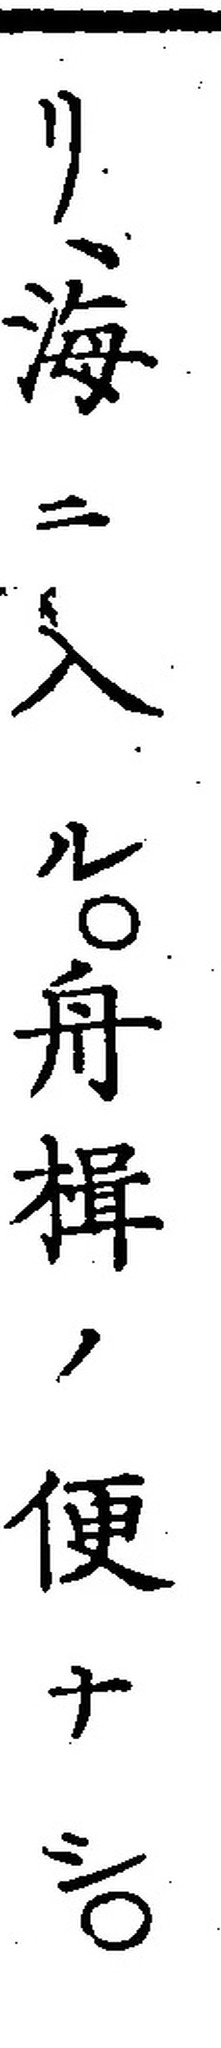リ、海ニ入ル。舟楫ノ便ナシ。
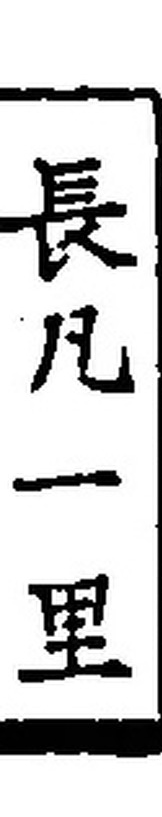長凡一里
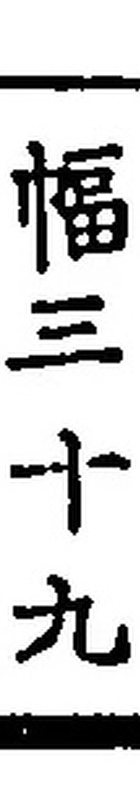幅三十九
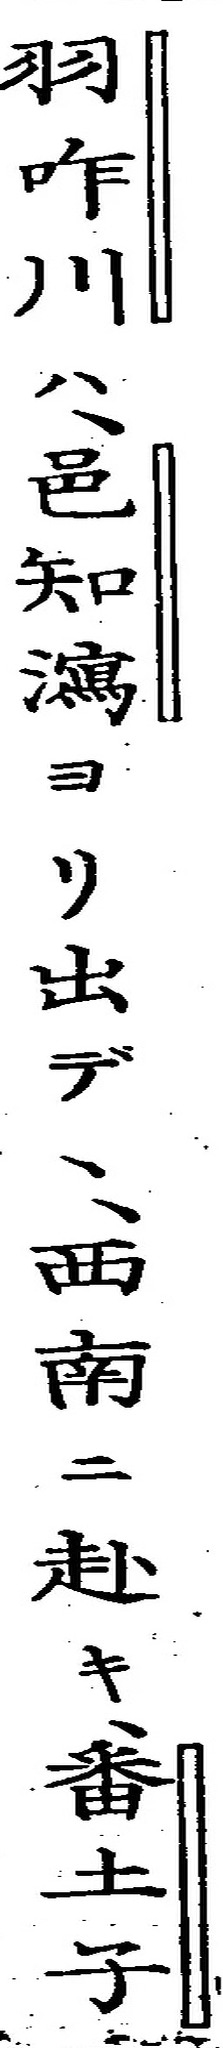羽咋川ハ、邑知瀉ヨリ出デヽ、西南ニ赴キ、番土子
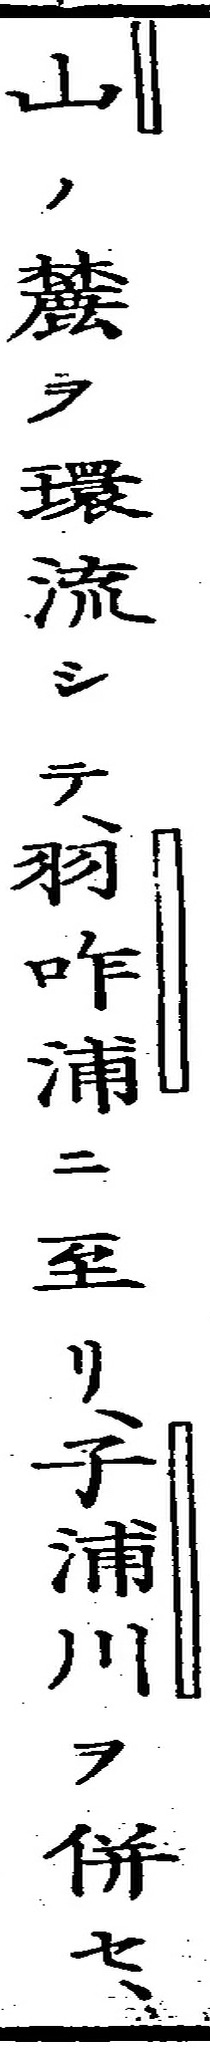山ノ麓ヲ環流シテ、羽咋浦ニ至リ、子浦川ヲ併セ、

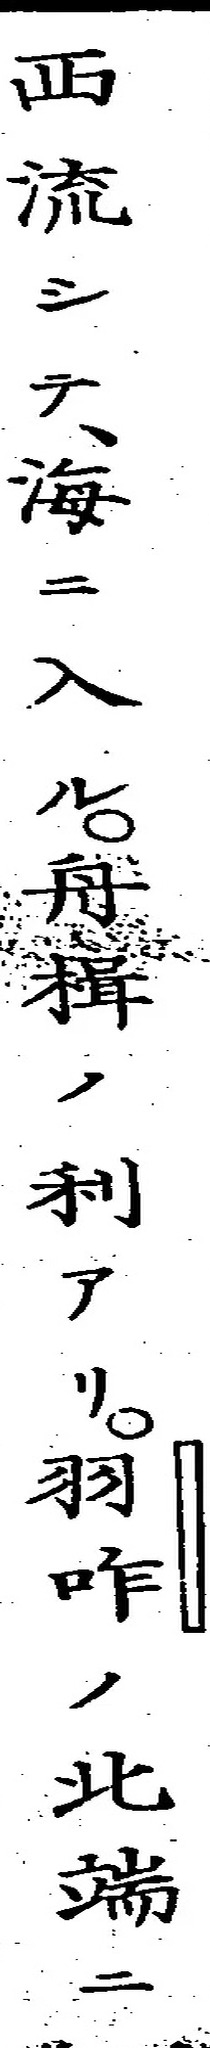西流シテ、海ニ入ル。舟楫ノ利アリ。羽咋ノ北端ニ
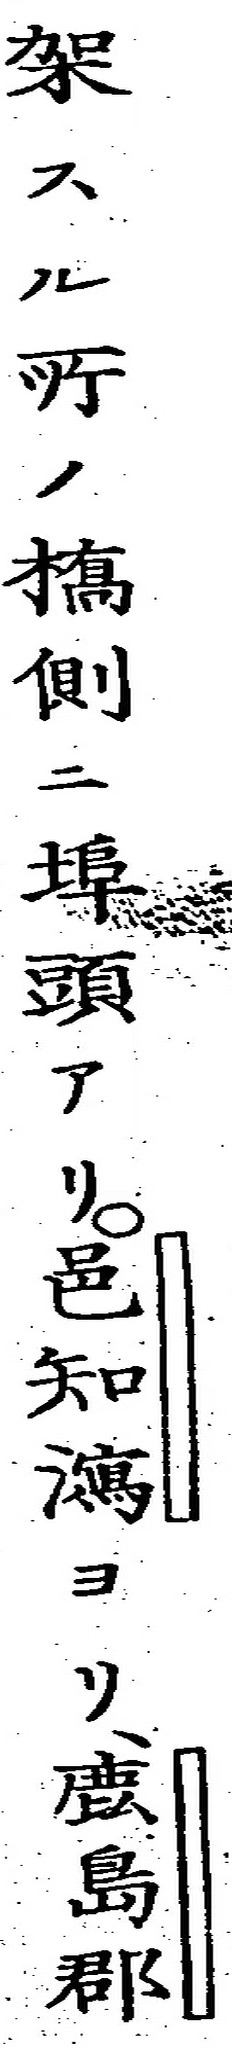架スル所ノ橋側ニ埠頭アリ。邑知瀉ヨリ、鹿島郡
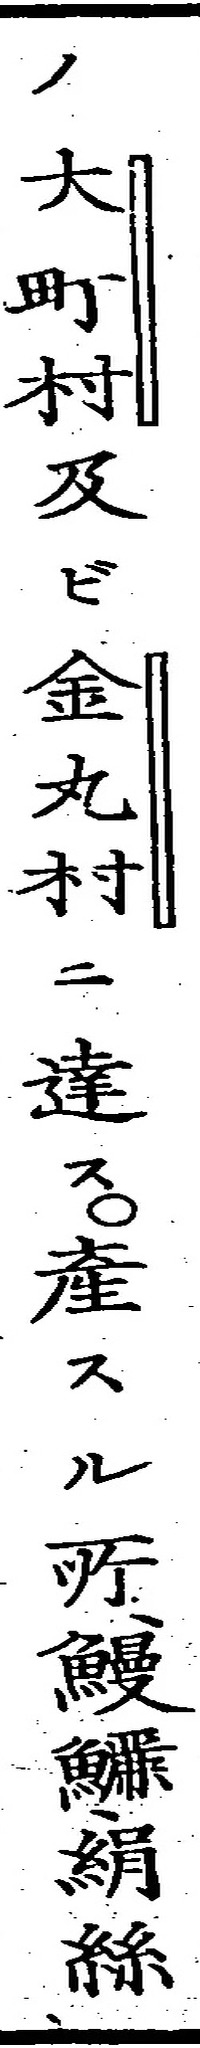ノ大町村及ビ金丸村ニ達ス。産スル所、鰻鱺・絹糸
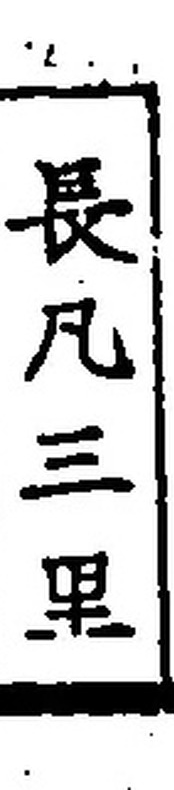長凡三里
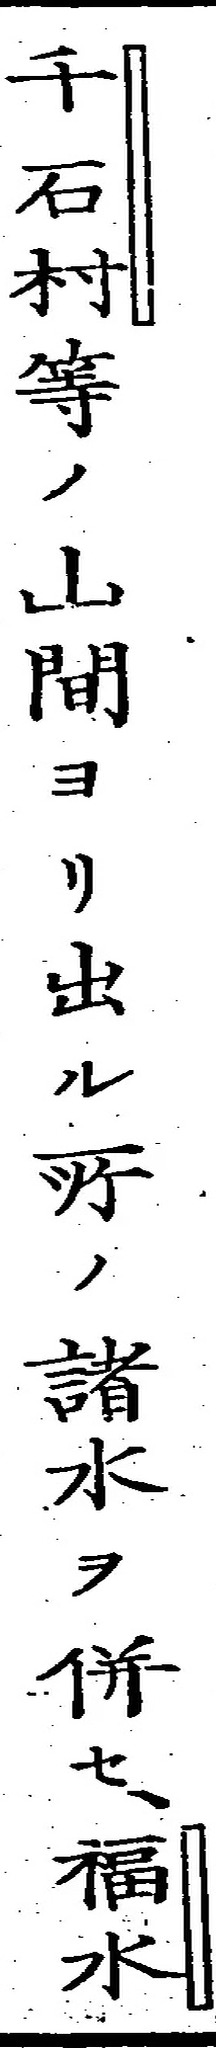千石村等ノ山間ヨリ出ル所ノ諸水ヲ併セ、福水
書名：能登地誌略
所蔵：国立国会図書館 National Diet Library, JAPAN
